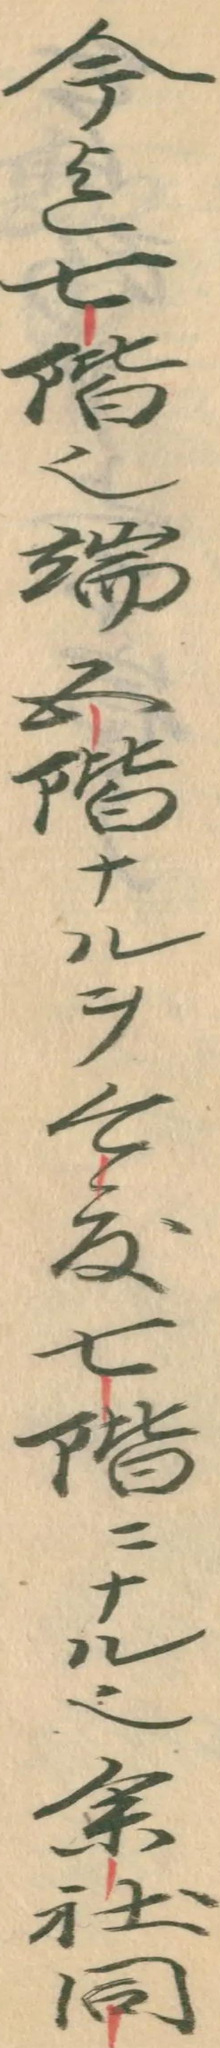今迄七-階也端五-階ナルヲ今-度七-階ニナル也余-社同-
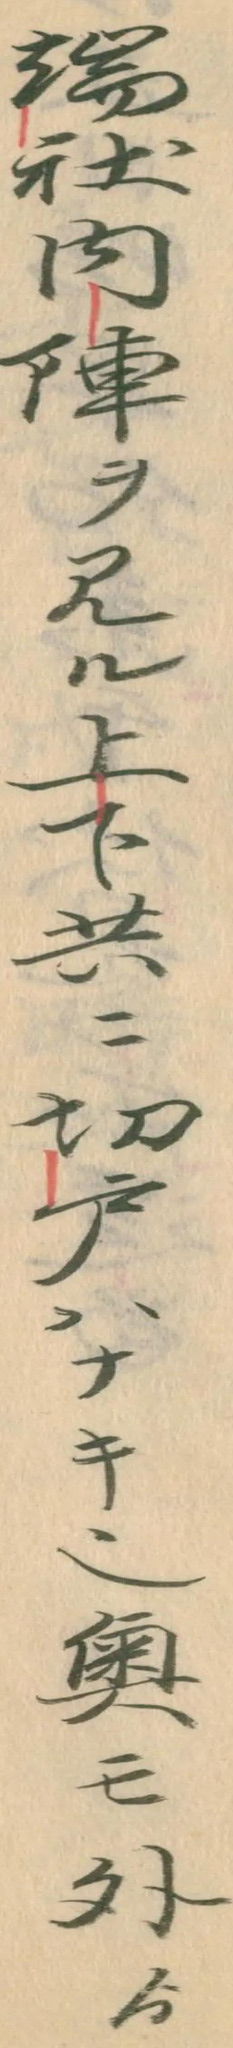端_社内-陣ヲ見ル上-下共ニ切_戸ハナキ也奥モ外ゟ
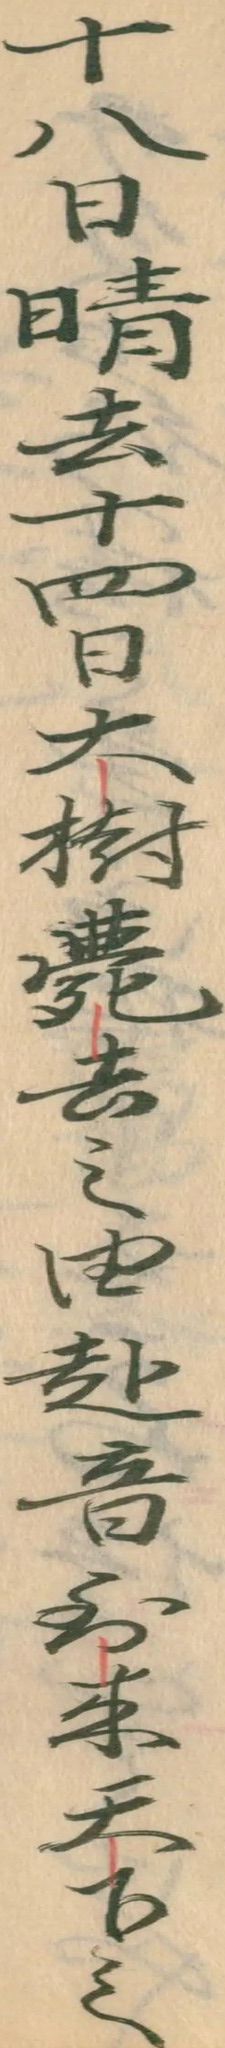十八日晴去十四日大-樹薨-去之由赴音到-来天-下之
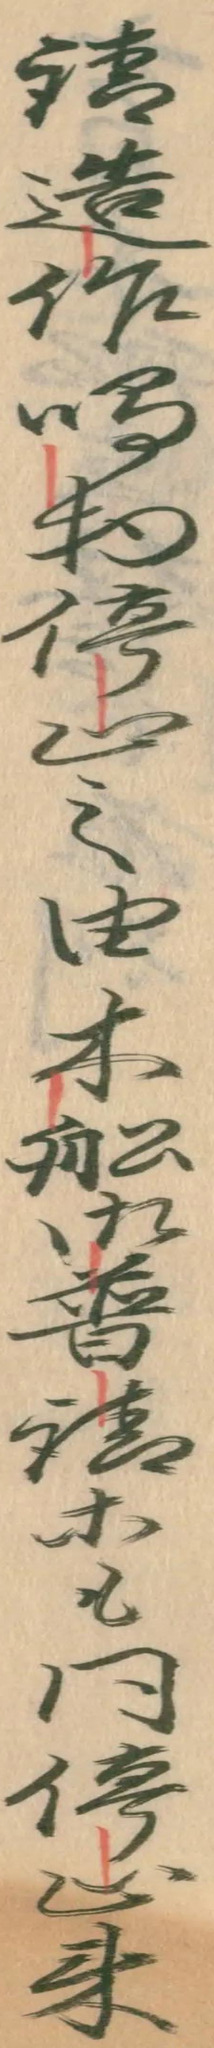請造-作鳴_物停-止之由木_船御-普-請等も同停-止来
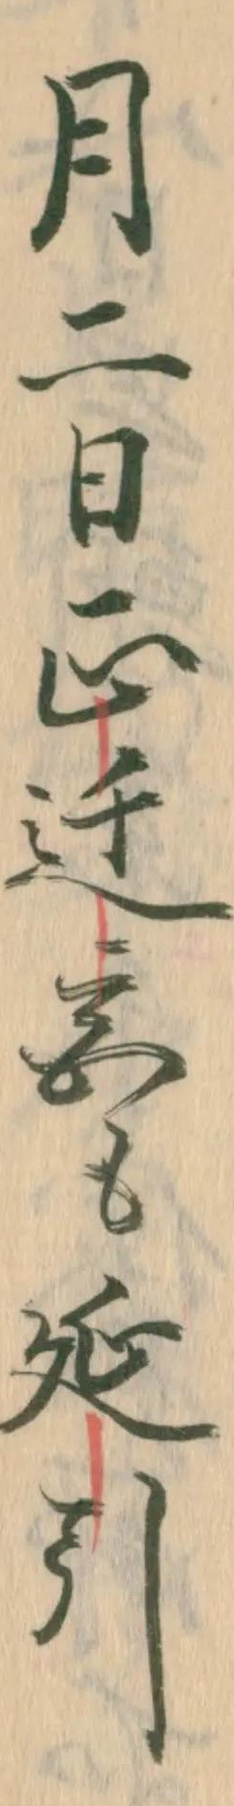月二日正-迁-宮も延-引
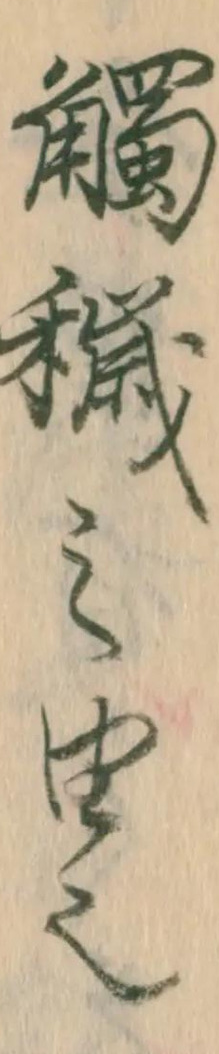触穢之由也
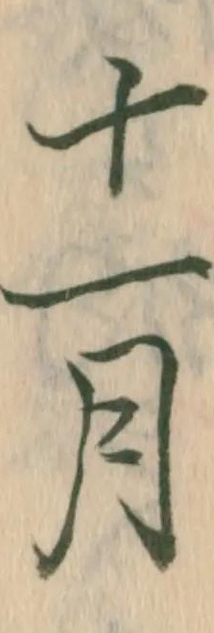十一月
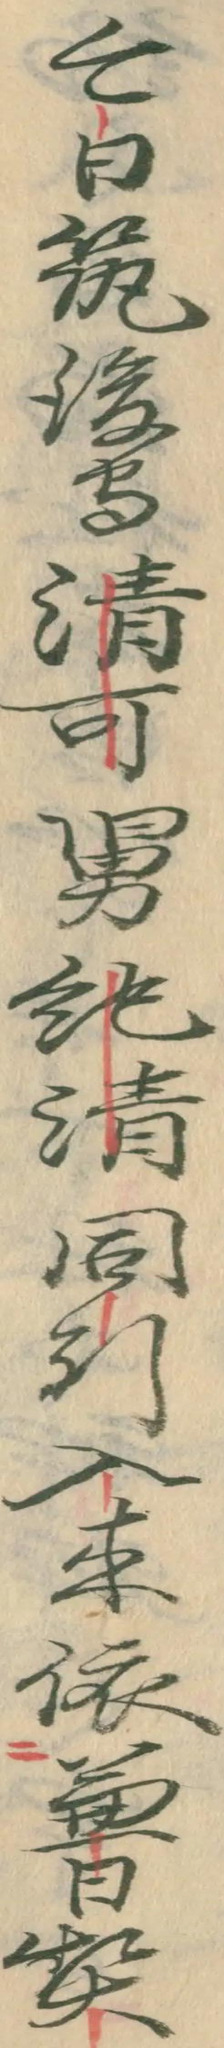今-日筑後守清可舅紀清同-引入-来依兼-日契-

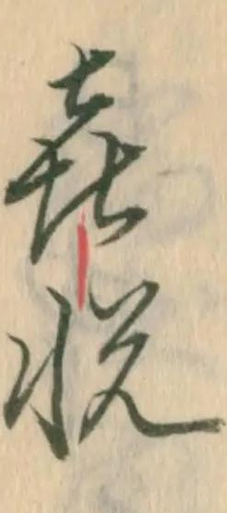喜-悦
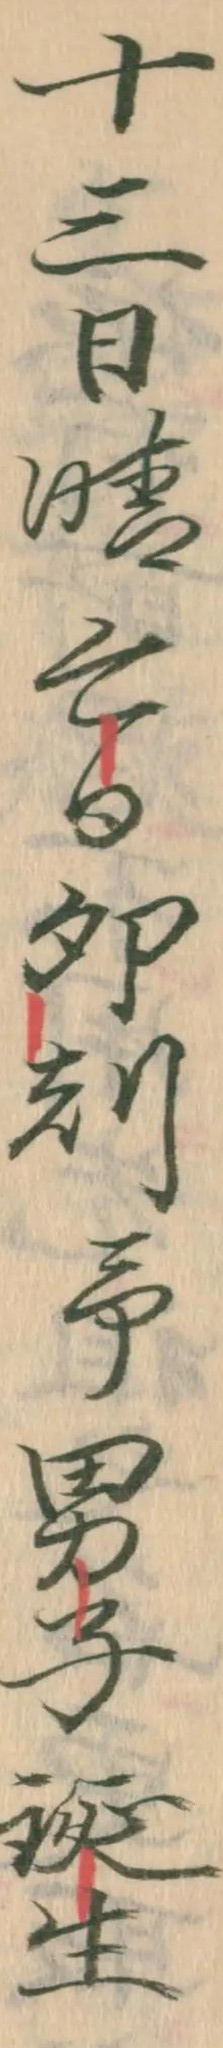十三日晴今-日卯_刻予男-子誕-生
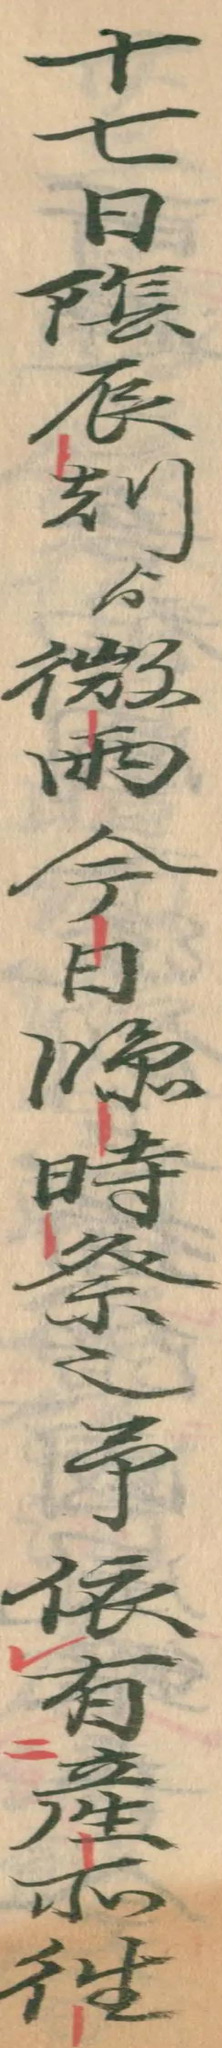十七日陰辰_刻ゟ微-雨今-日臨-時_祭也予依有産-所往-
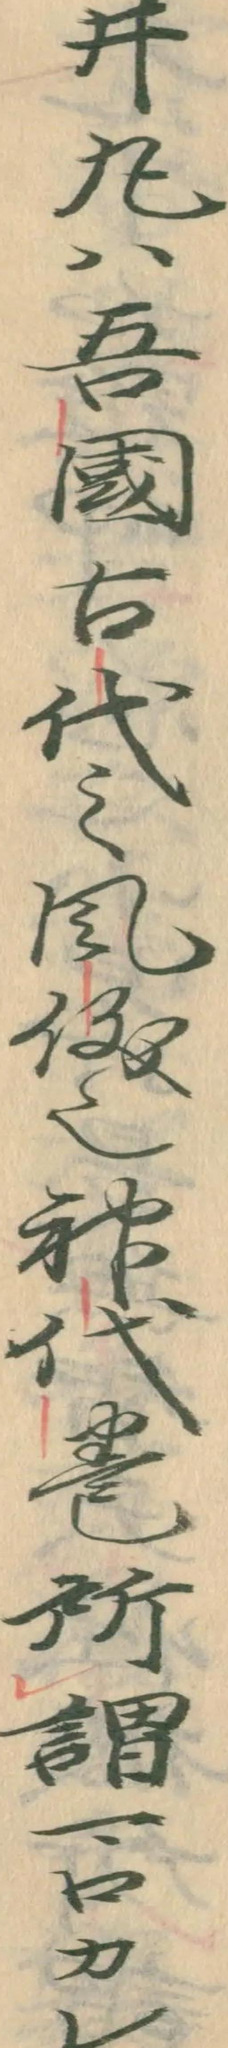井丸ハ吾_国古-代之風-儀也神-代_巻所謂マロカレ

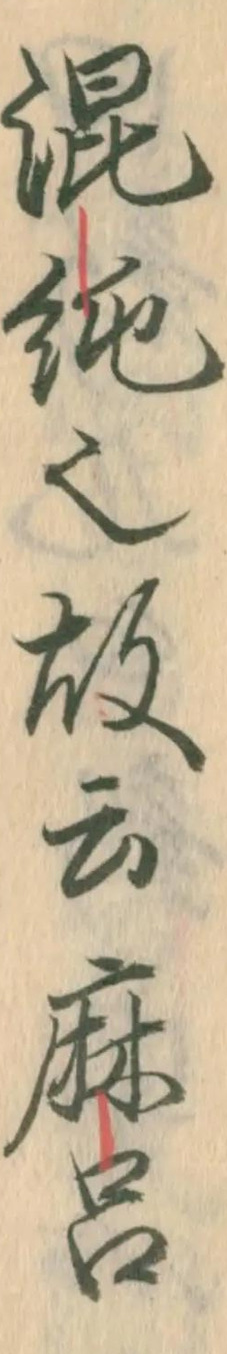混-純也故云麻-呂
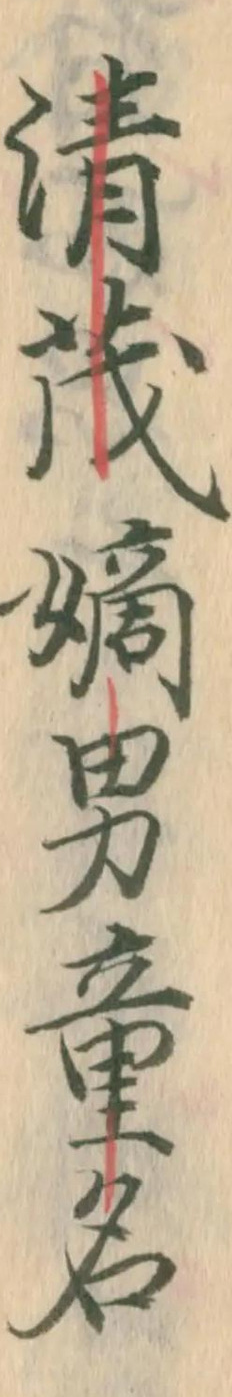清茂嫡-男童-名
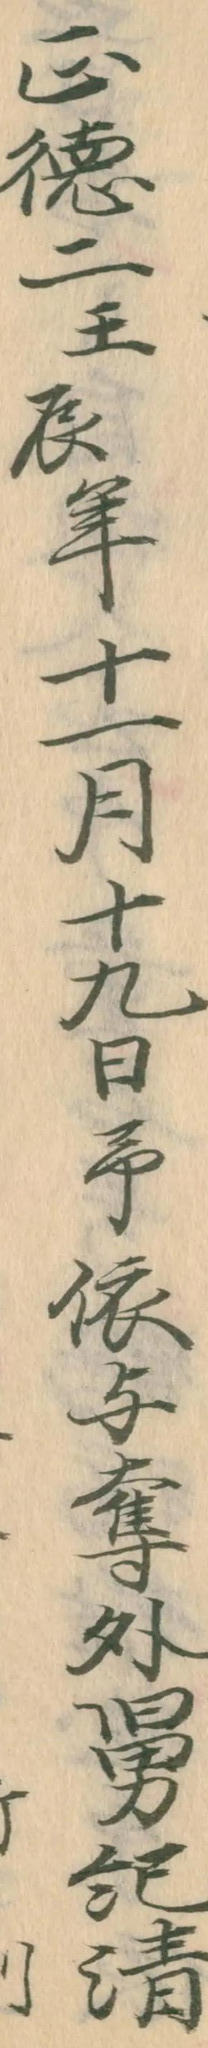正徳二壬辰年十一月十九日予依与奪外舅紀清
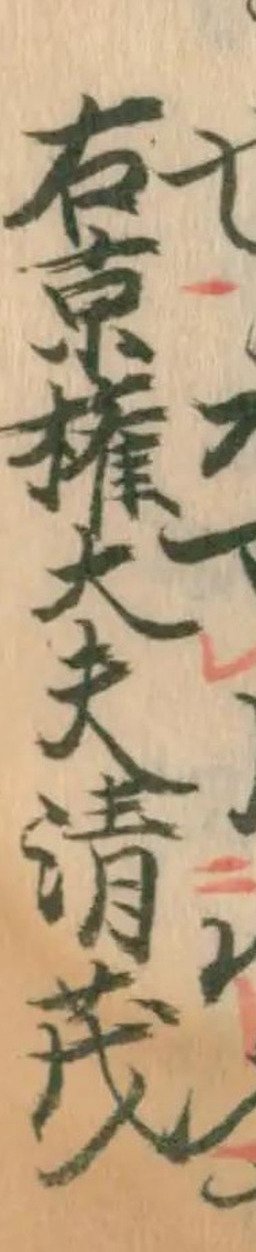右京権大夫清茂
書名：賀茂社記録. 第16冊
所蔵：国立国会図書館 National Diet Library, JAPAN
